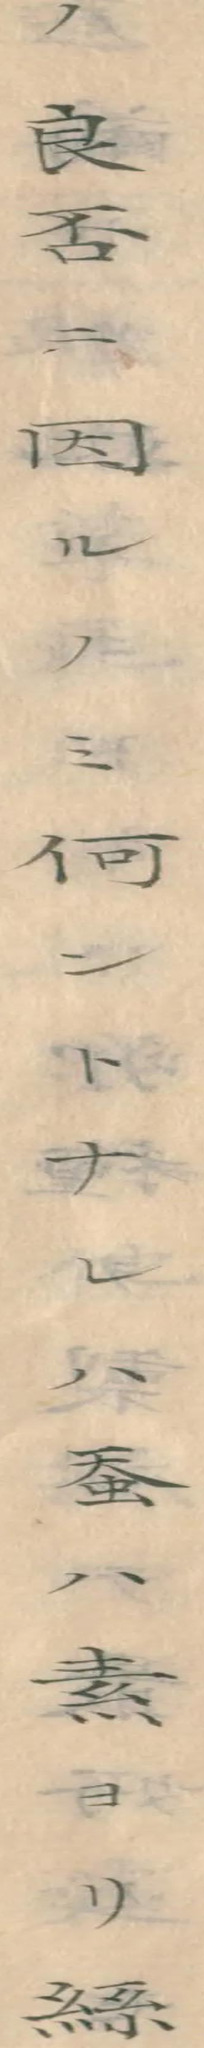ノ良否ニ因ルノミ何ントナレハ蚕ハ素ヨリ絲
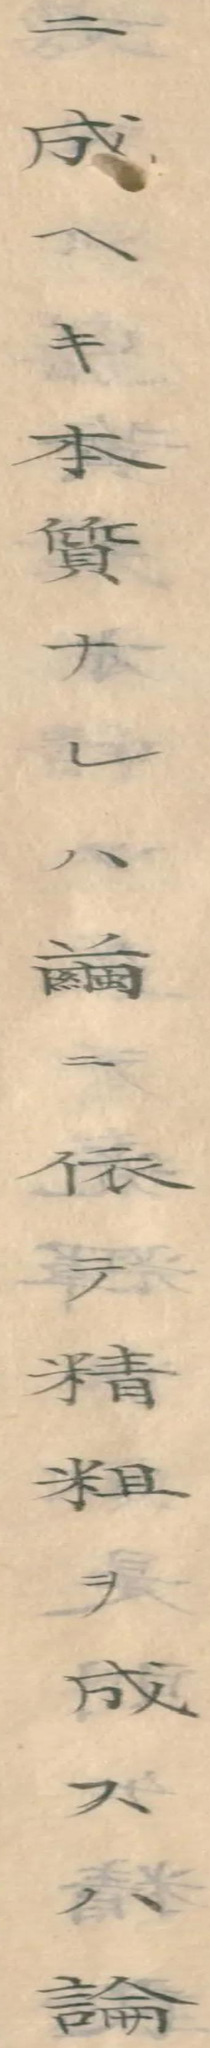ニ成ヘキ本質ナレハ繭ニ依テ精粗ヲ成スハ論
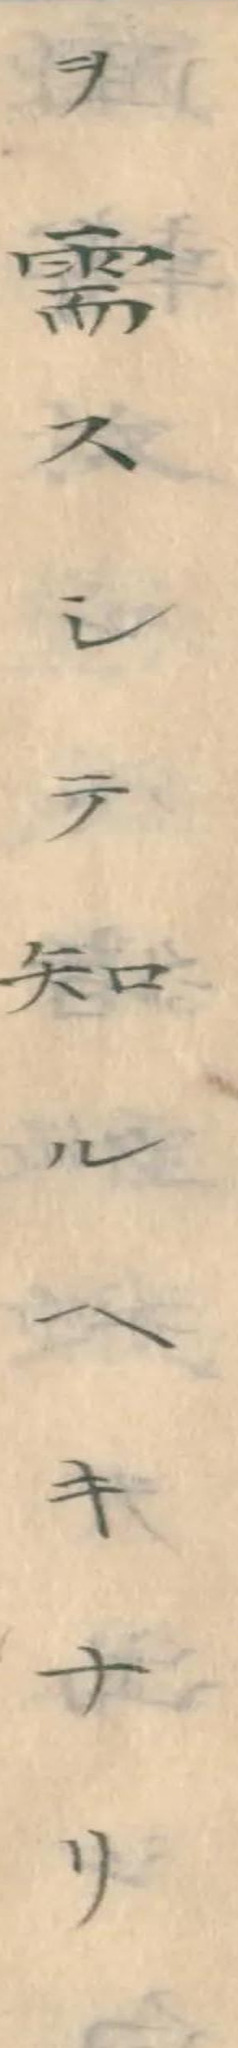ヲ需スシテ知ルヘキナリ
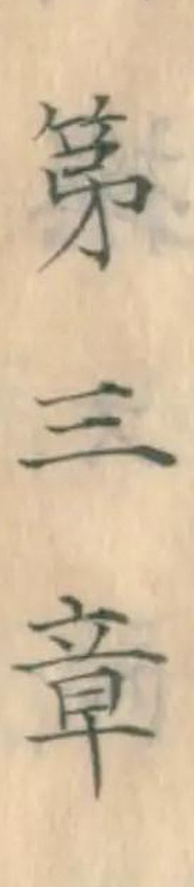第三章

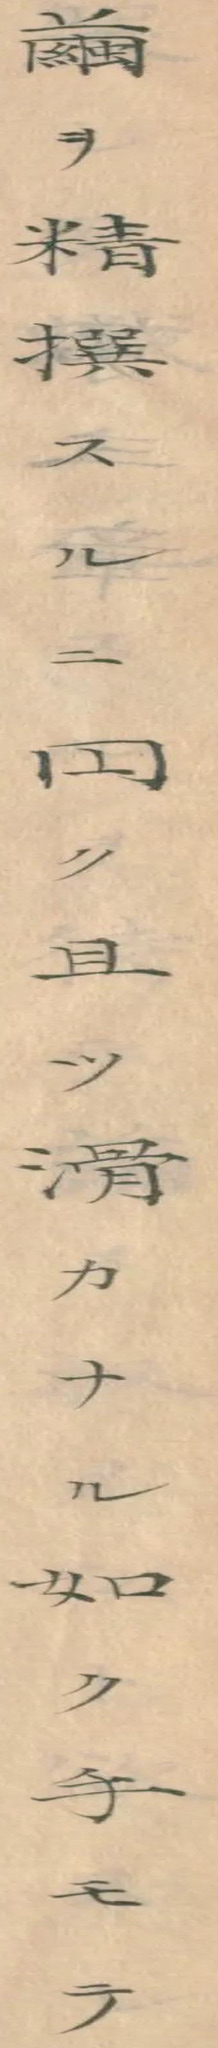繭ヲ精撰スルニ円ク且ツ滑カナル如ク手モテ
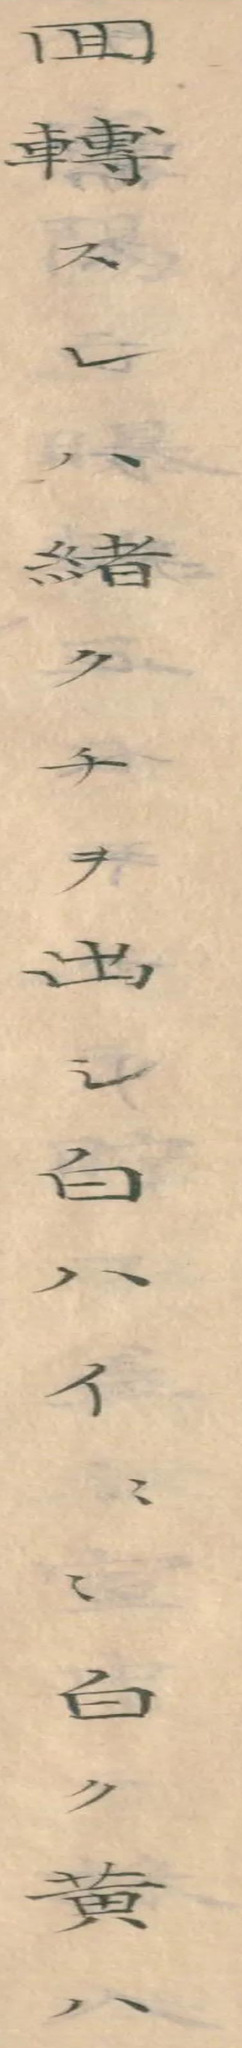回転スレハ緒クチヲ出シ白ハイヽヽ白ク黄ハ
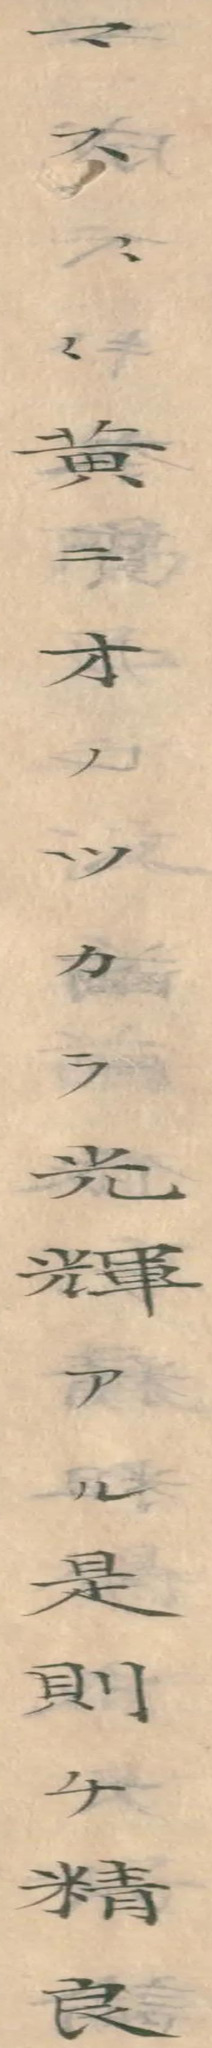マスヽヽ黄ニオノツカラ光輝アル是則チ精良
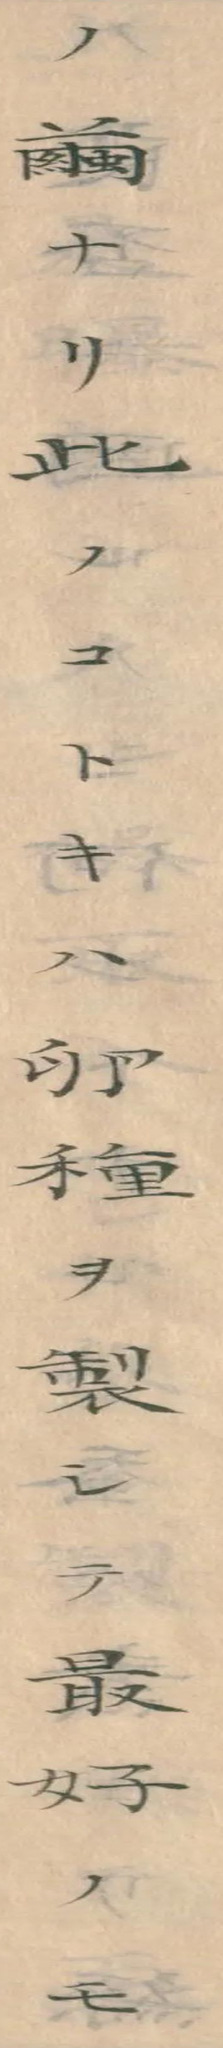ノ繭ナリ此ノコトキハ卵種ヲ製シテ最好ノモ
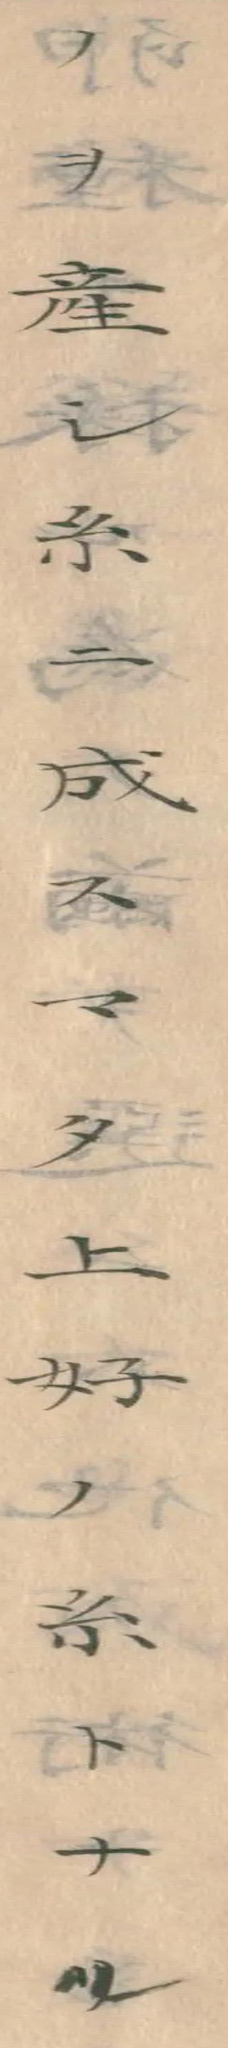ノヲ産シ糸ニ成スマタ上好ノ糸トナル
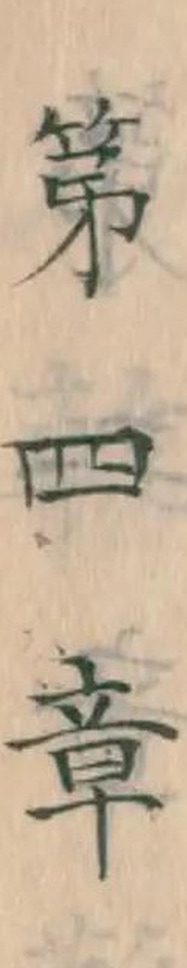第四章
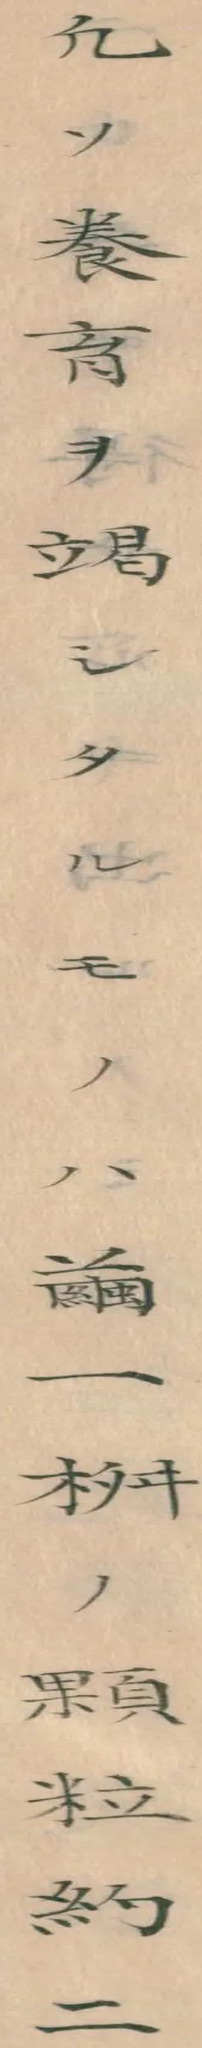凡ソ養育ヲ竭シタルモノハ繭一桝ノ顆粒約二
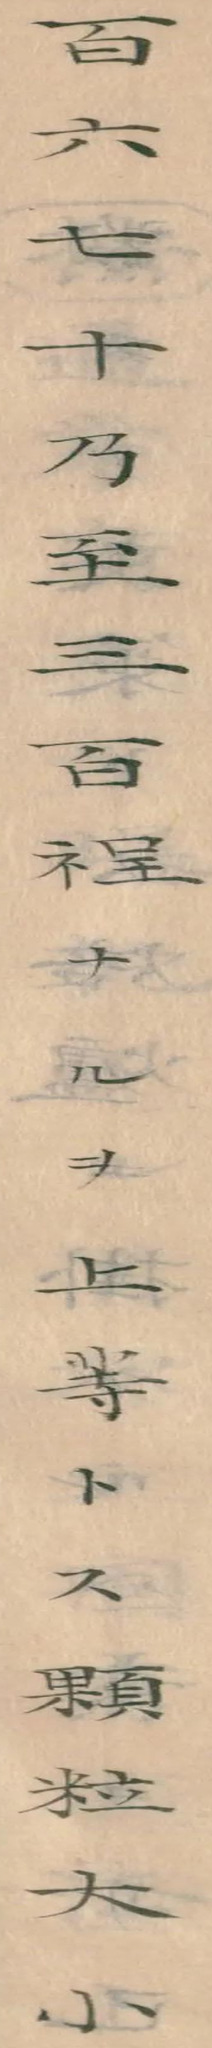百六七十乃至三百程ナルヲ上等トス顆粒大小
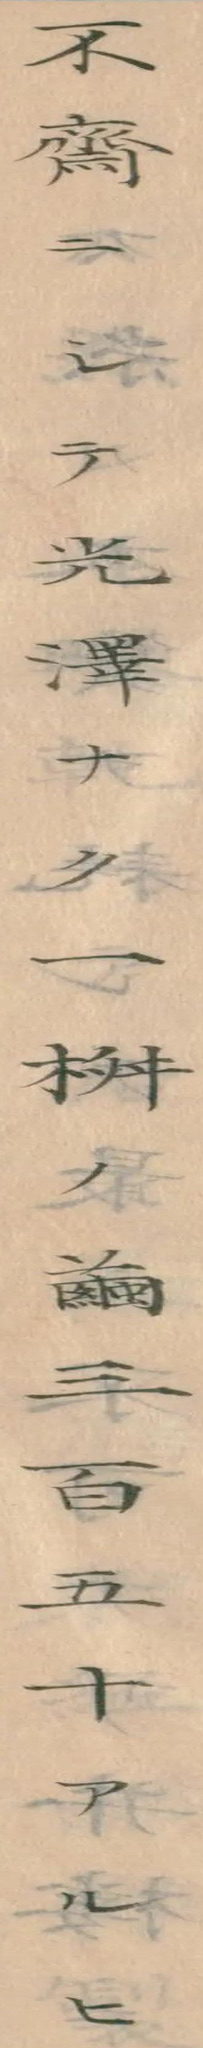不斉ニシテ光沢ナク一桝ノ繭三百五十アルヒ
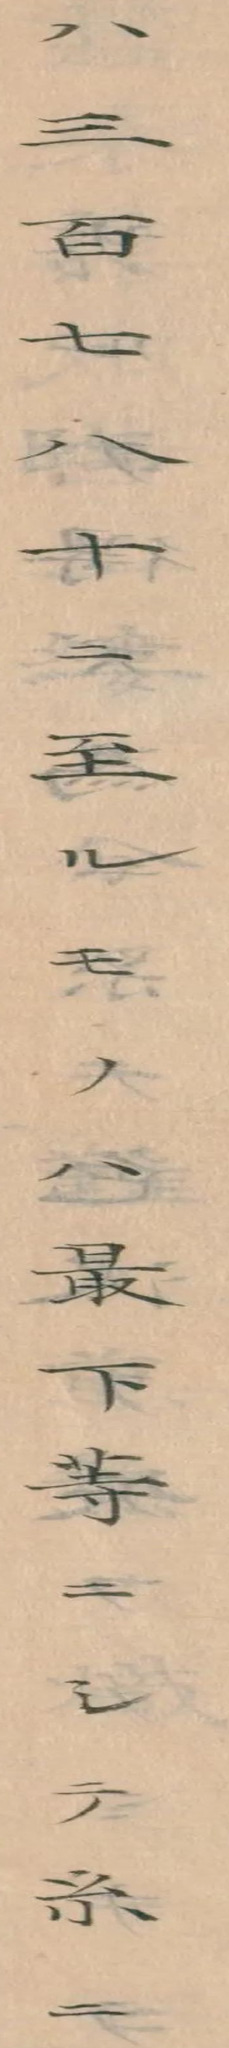ハ三百七八十ニ至ルモノハ最下等ニシテ糸ニ
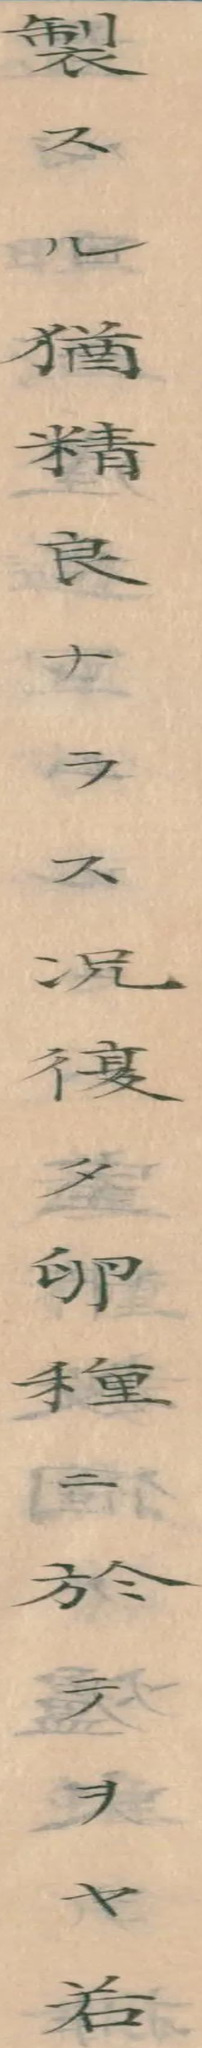製スル猶精良ナラス况復タ卵種ニ於テヲヤ若
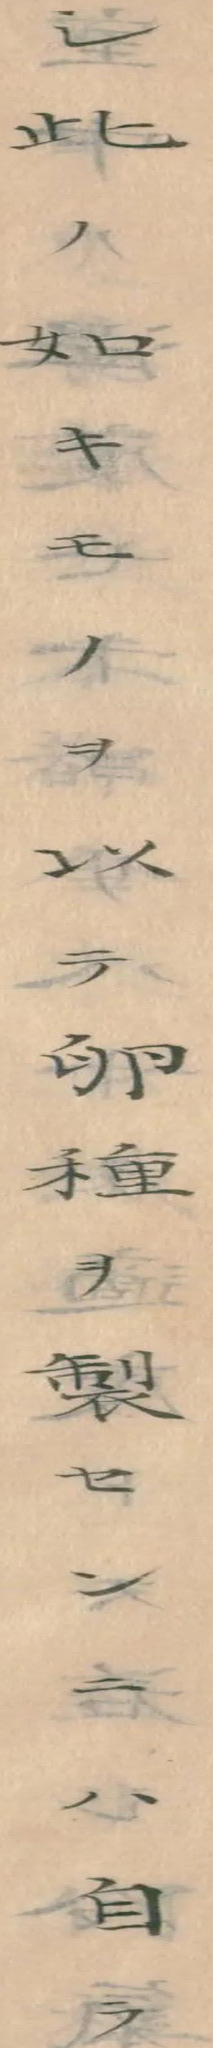シ此ノ如キモノヲ以テ卵種ヲ製センニハ自ラ
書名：蚕桑集成
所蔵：国立国会図書館 National Diet Library, JAPAN
